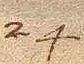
24
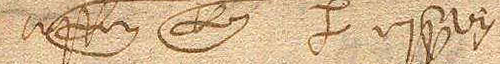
af̄fom Roz ho esp̄vy
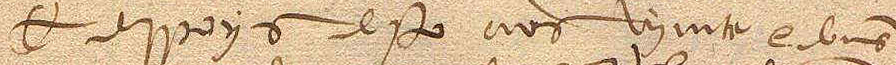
E despoys desto aos vymte e dous
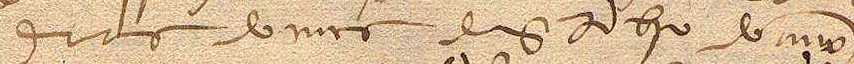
dias do mes de setēbro do āno
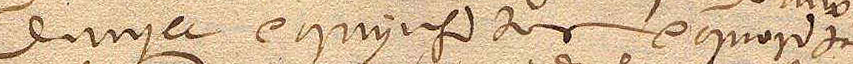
de mjll e quynhētos e quorēta
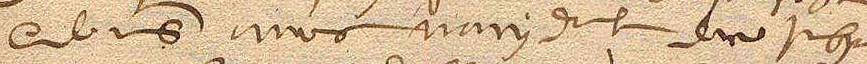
e dous anos na cydade de coJnbra
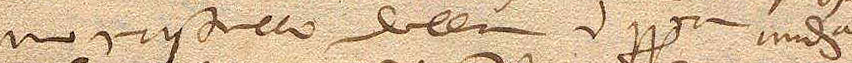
no castello della ē ꝓpca audja
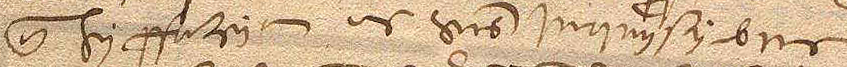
q̄ hy ffazyam os snr̄s Jnquysydores
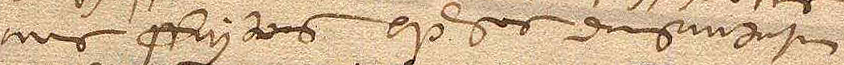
aos ffeytos e p̄sos da santa Jm
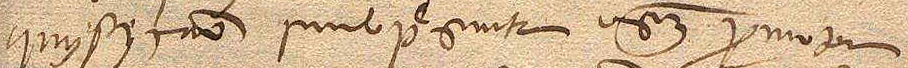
quysycão sendo p̄semte o s̄or ꝓmotor
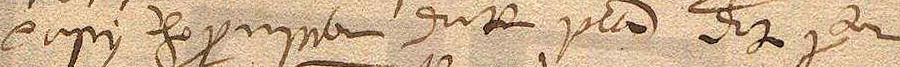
e asy ho ꝑcurador da Re pl̄lo dito ꝓtor
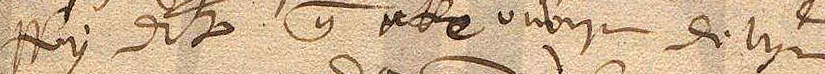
ffoy dito q̄ a Re ouvera de vyr
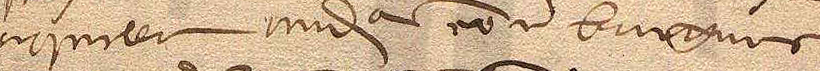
aquella audja c̄o ēbarguos
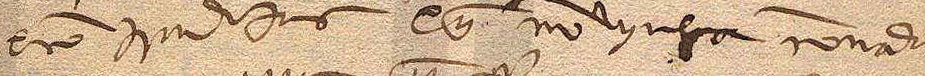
e c̄otraditas e q̄ n̄o vynha c̄o nada
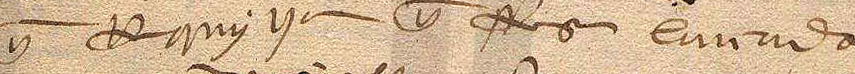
q̄ Requyrja q̄ ffose lançada
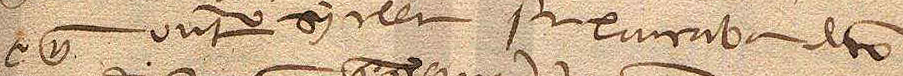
e q̄ outrosy elle se lançava de c̄o
